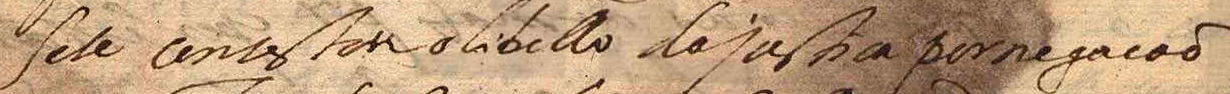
Sete contestou o libello da justica por negacaõ
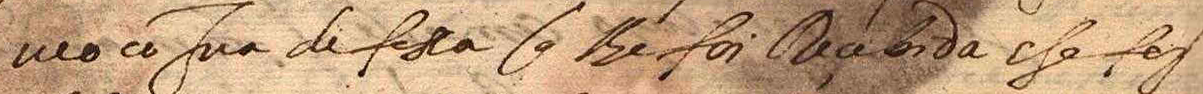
ueo cō sua defessa q̄ lhe foi Reçebida E se fez
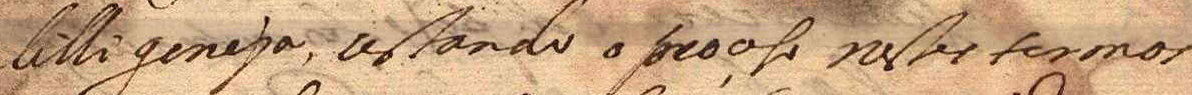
dilligencja, e estando o proçeso nestes termos
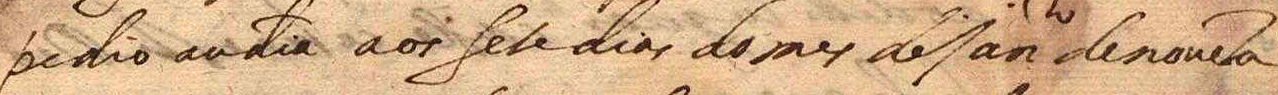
pedio audīa aos sete dias do mes de Janro de nouēta
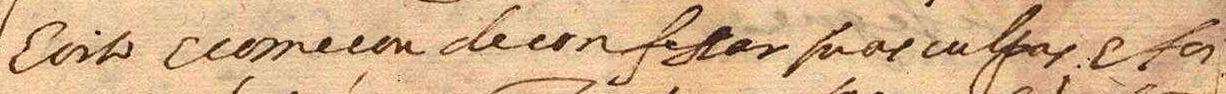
E oito e começou de confessar suas culpas E foi
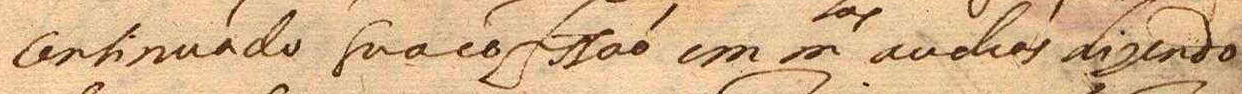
Continuādo sua cōfissaõ em mtas audiās dizendo
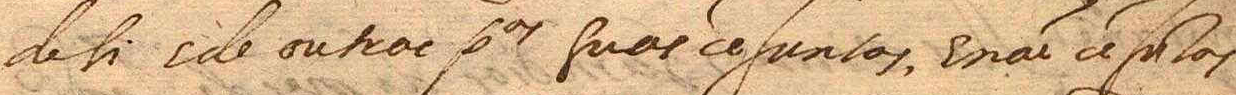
de si E de outras pas suas cōJuntas, E naõ cōJūtas
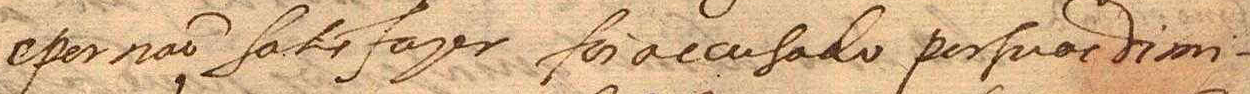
E per naõ satisfazer foi accusado per suas dimi
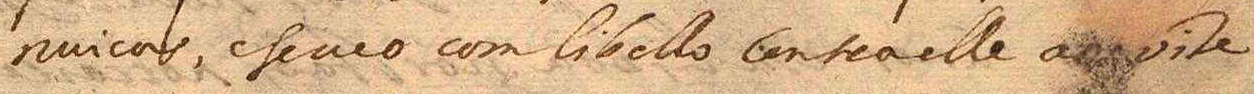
nuicoẽs, e se ueo com libello contra elle aos vīte
